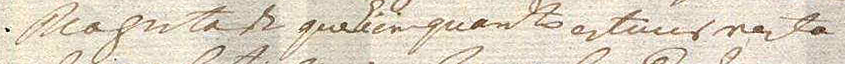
Magestade que he emquanto estiuer nesta
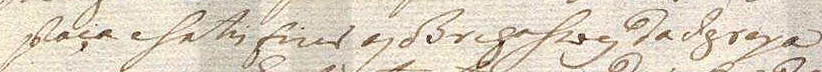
pRaça e satisfizer as obregassoes da Igreya
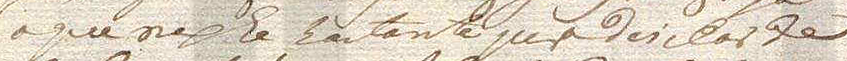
o que naõ he bastante pera deichar de
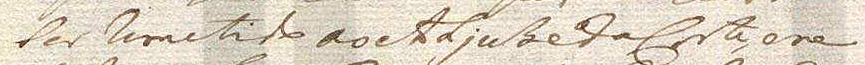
ser Remetido ao ALjube da Corte, e ne
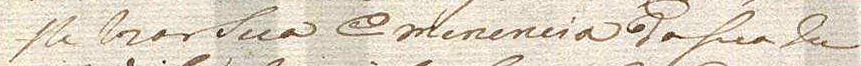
lle vzar Sua emenencia da sua Iu
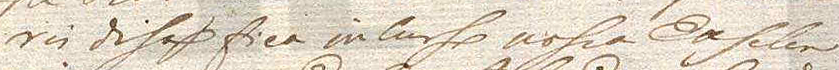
risdisaõ fica inCurso uossa Exselen
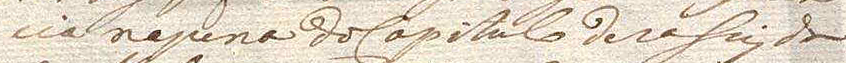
cia na pena do Capitulo dezaseis da
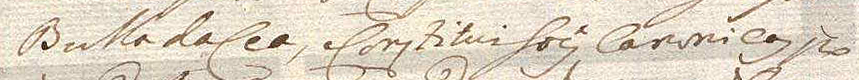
Bulla da Cea, e Constituisoẽs Canonicas po
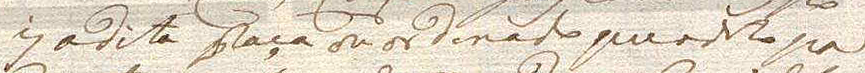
is a dita pRaça ou ordenado que o dito pa
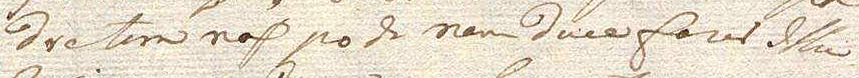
dre tem naõ pode nem deue fazer Illu
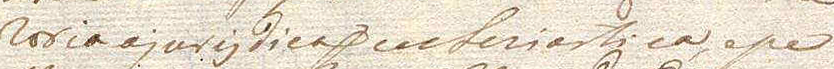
zoria a jurisdiçaõ eccleziastica, e pe
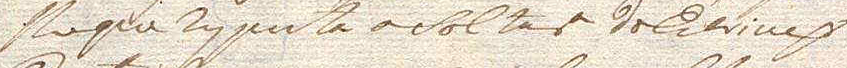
llo que Respeita a Soltura do Escriueõ
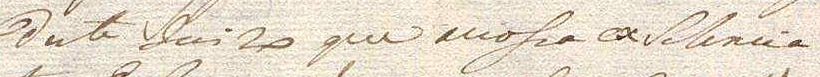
deste Iuizo que a uossa exselencia
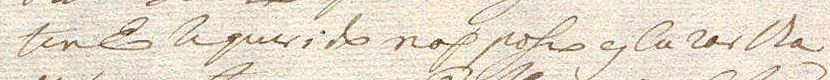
tenho Requerido naõ posso esCuzarlha
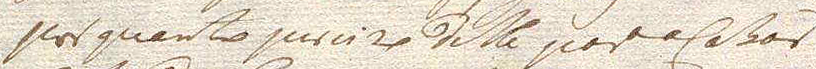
porquanto percizo delle por aCabar
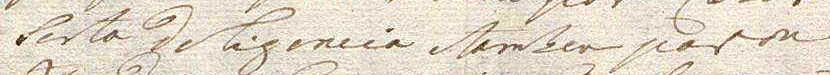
serta deligencia e tambem por ou
